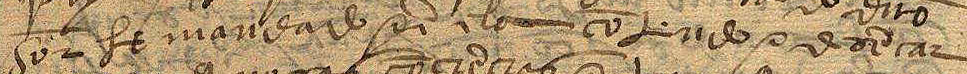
S̄or he mandado e ē ela cōteudo e desēcar
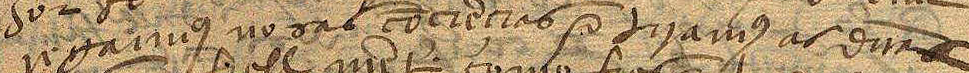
regamꝯ nosas cōciēcias e tiramꝯ as ditas
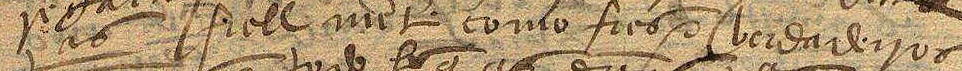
tas fiellmēte como fies e verdadeiros
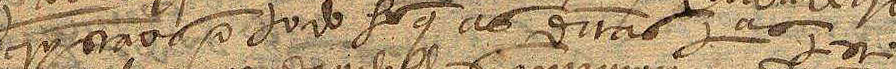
crystaõs e todo ho q̄ as ditas tas teste
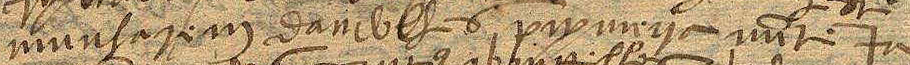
munharem dandolhes prymeiramēte Ju
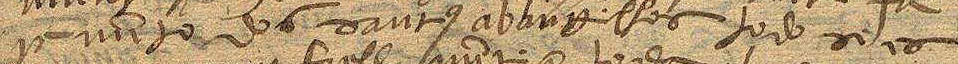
ramēto dos santꝯ avangelhos todo se es
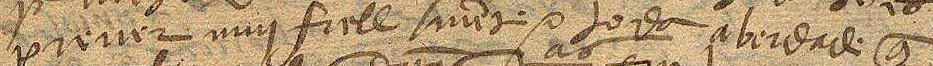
preuer muj fiellmēte e toda a verdade q̄
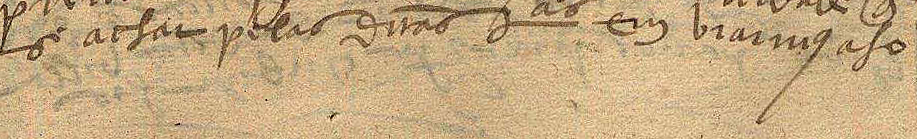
se achar pelas ditas tas Emviarmꝯ aho
